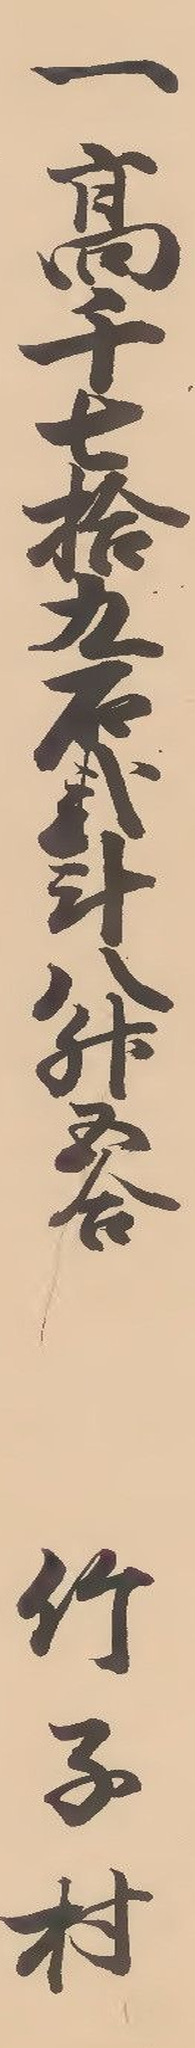一高千七拾九石弐斗八升五合竹子村
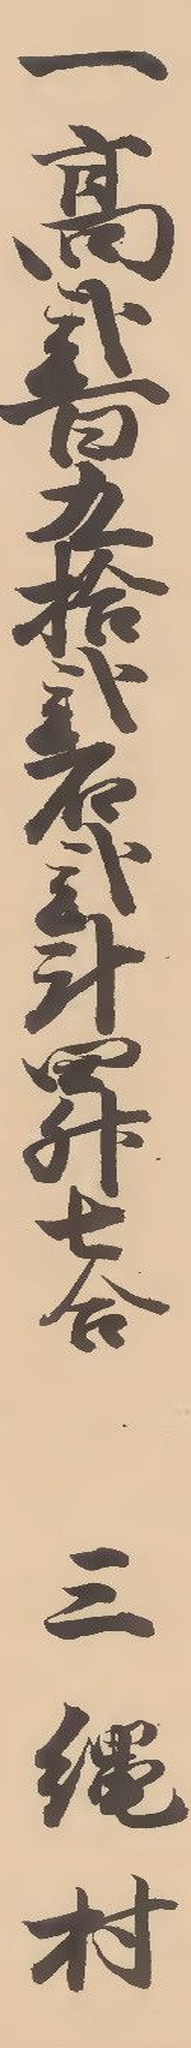一高弐百九拾弐石弐斗四升七合三縄村

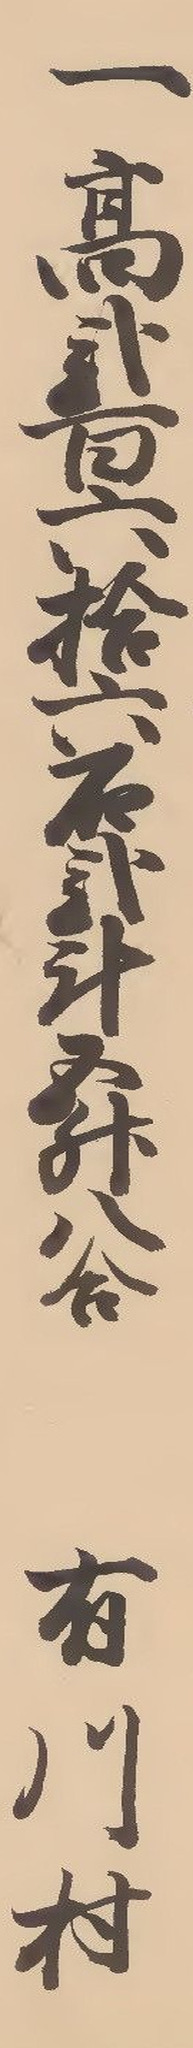一高弐百六拾六石弐斗五升八合有川村
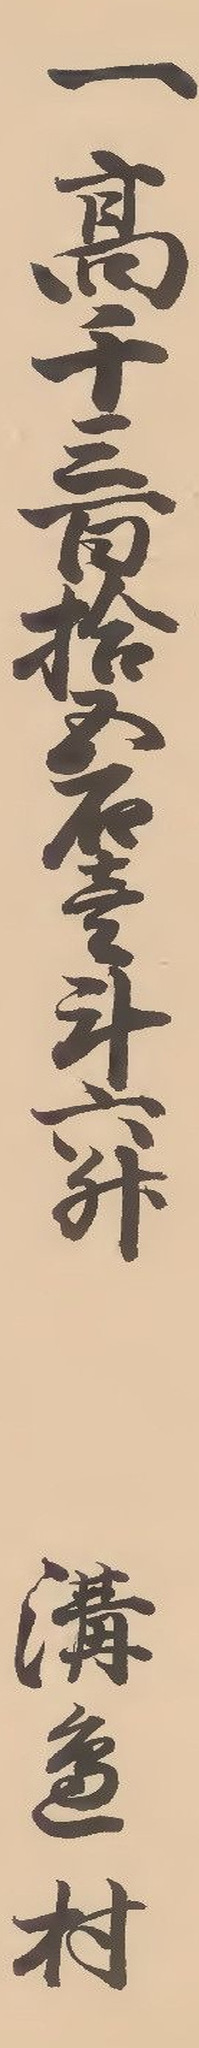一高千三百拾五石壱斗六升溝辺村
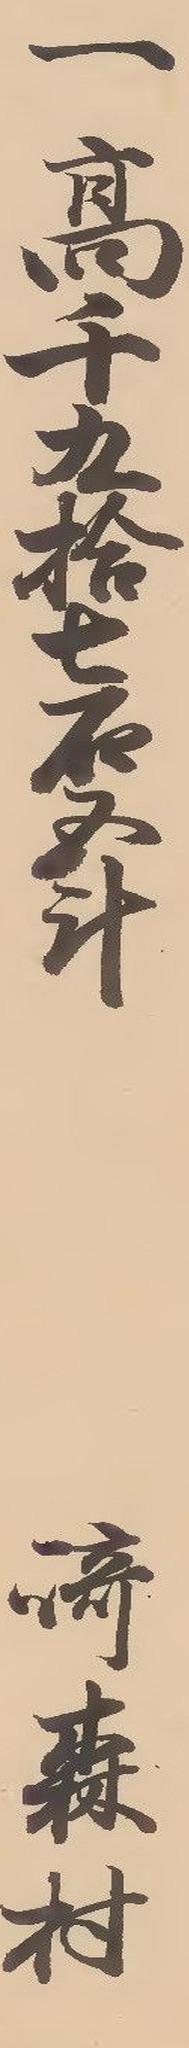一高千九拾七石五斗崎森村
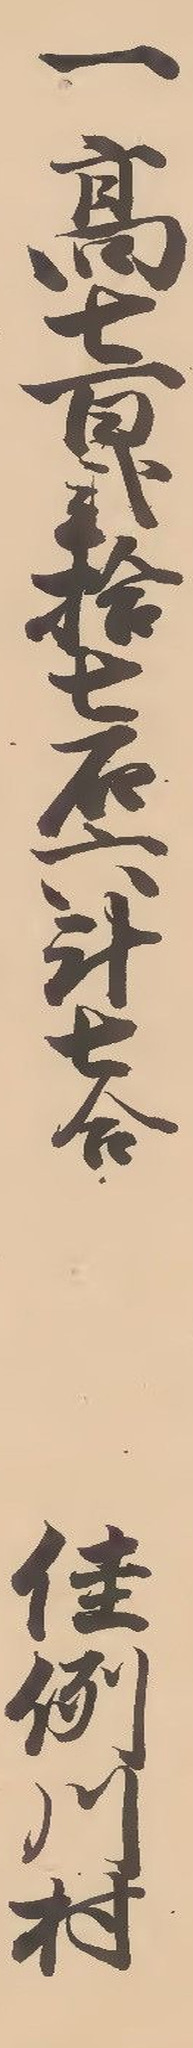一高七百弐拾七石六斗七合佳例川村
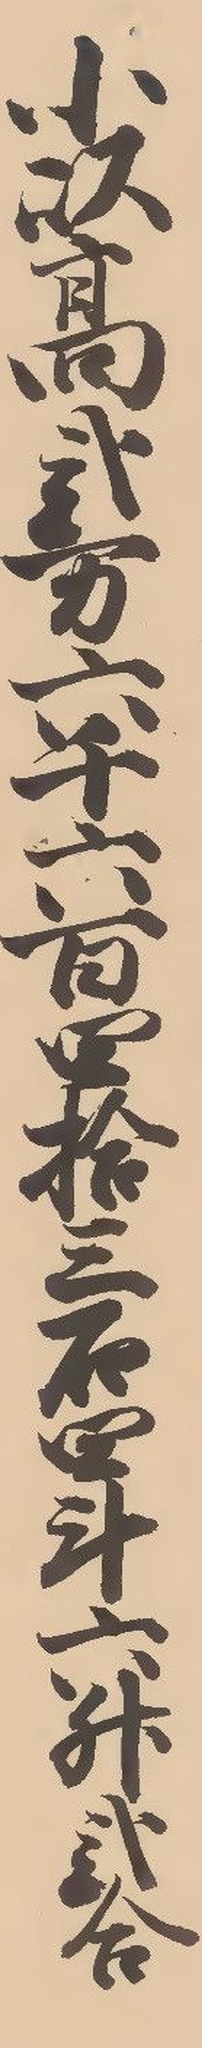小以高弐万六千六百四拾三石四斗六升弐合

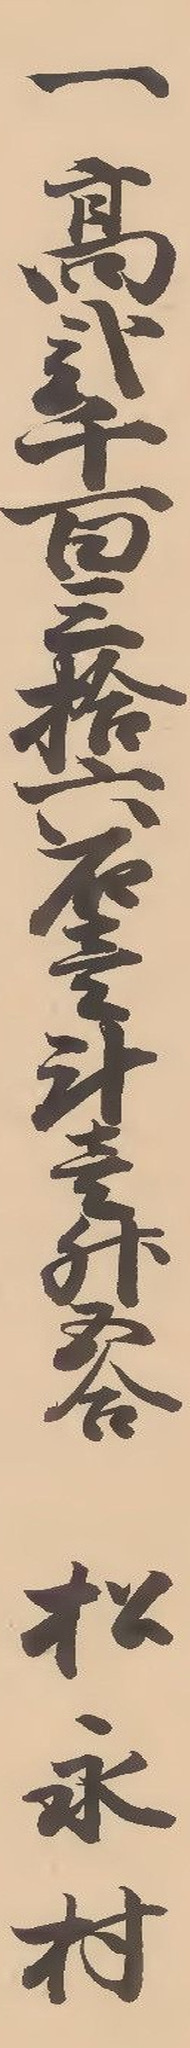一高弐千百三拾六石壱斗壱升五合松永村
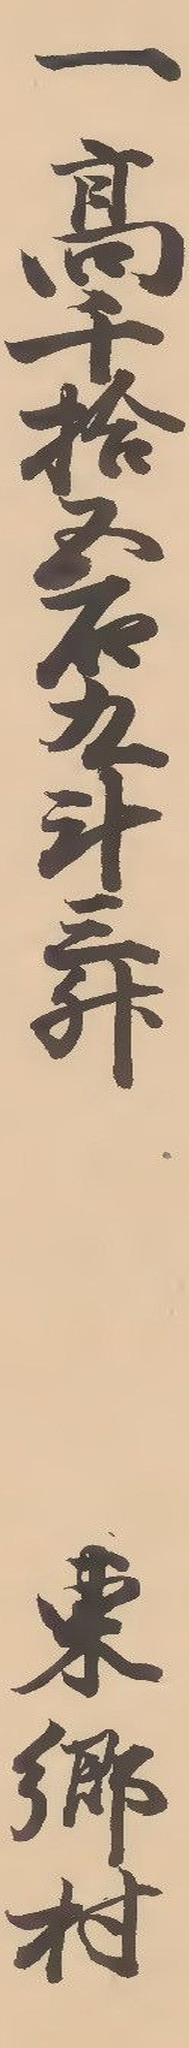一高千拾五石九斗三升東郷村
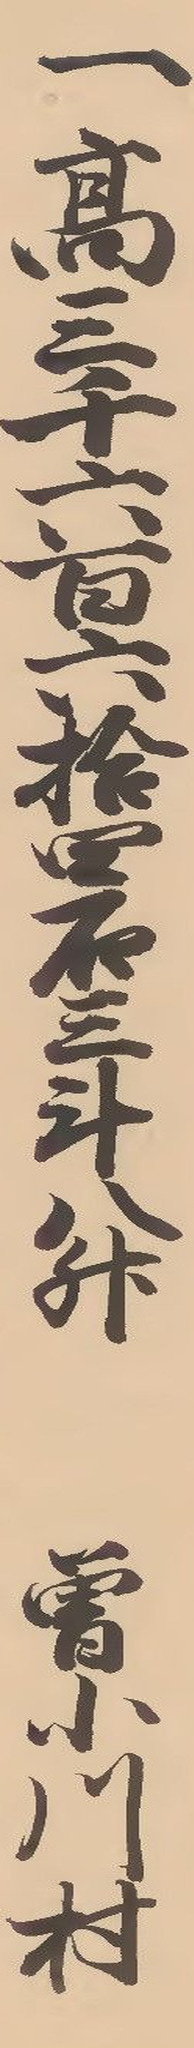一高三千六百六拾四石三斗八升曽小川村
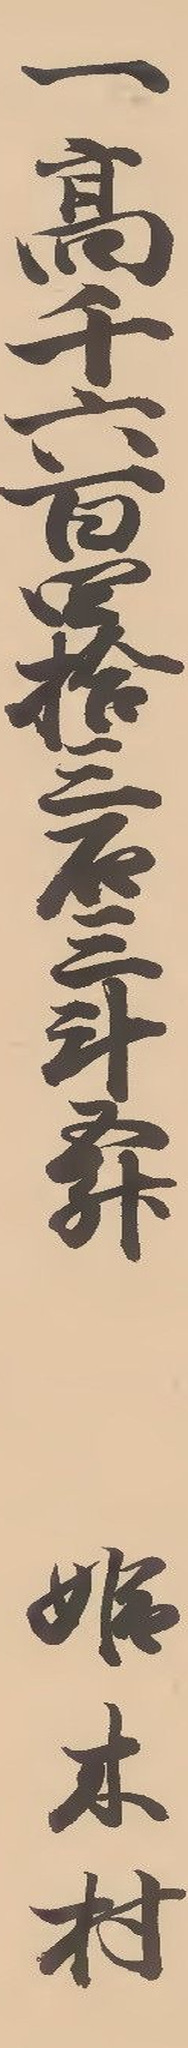一高千六百四拾三石三斗五升姫木村
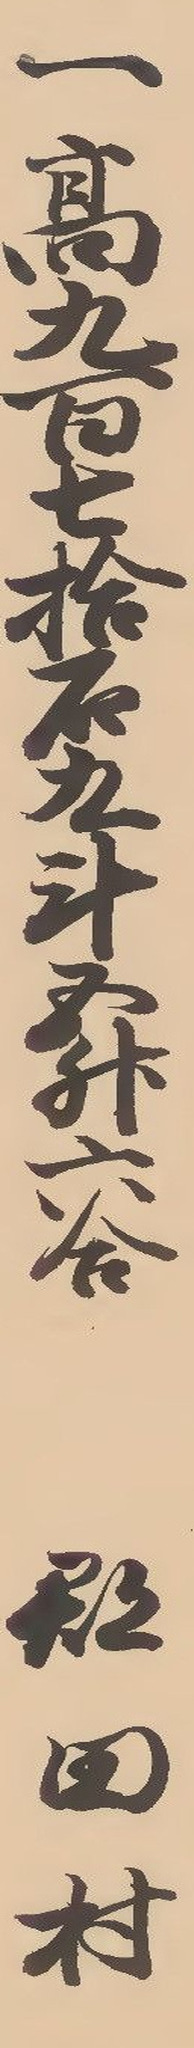一高九百七拾石九斗五升六合郡田村
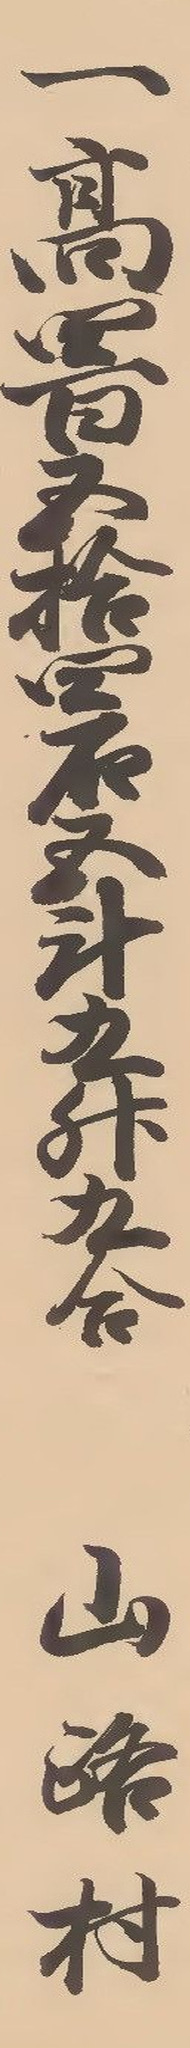一高四百五拾四石五斗九升九合山路村
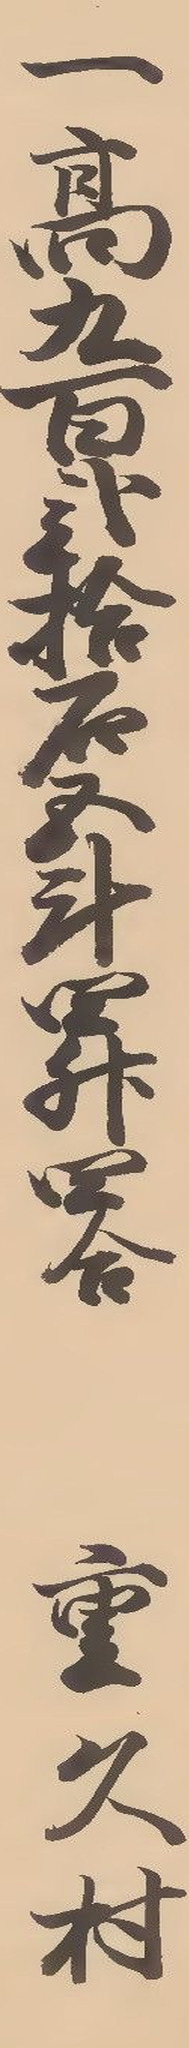一高九百弐拾石五斗四升四合重久村

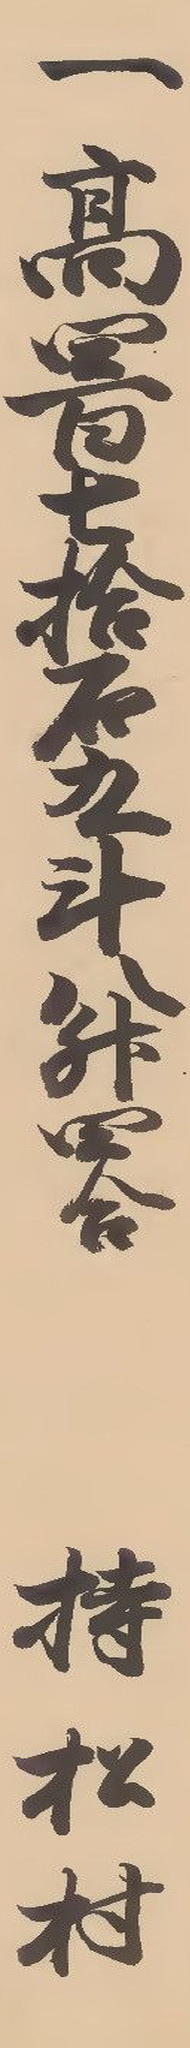一高四百七拾石九斗八升四合持松村
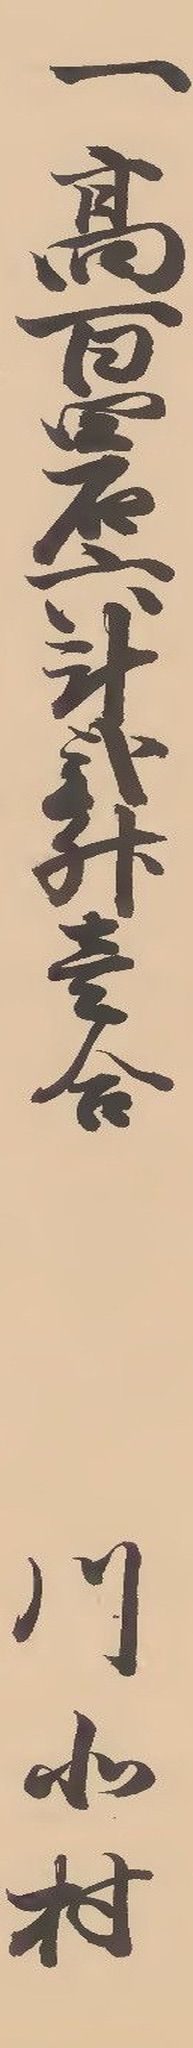一高百四石六斗弐升壱合川北村
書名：大隅国郷帳
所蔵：国立公文書館 National Archives of Japan
